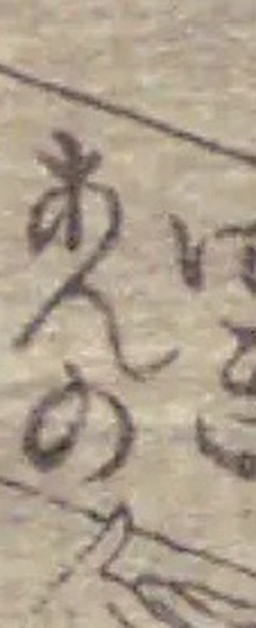あんの
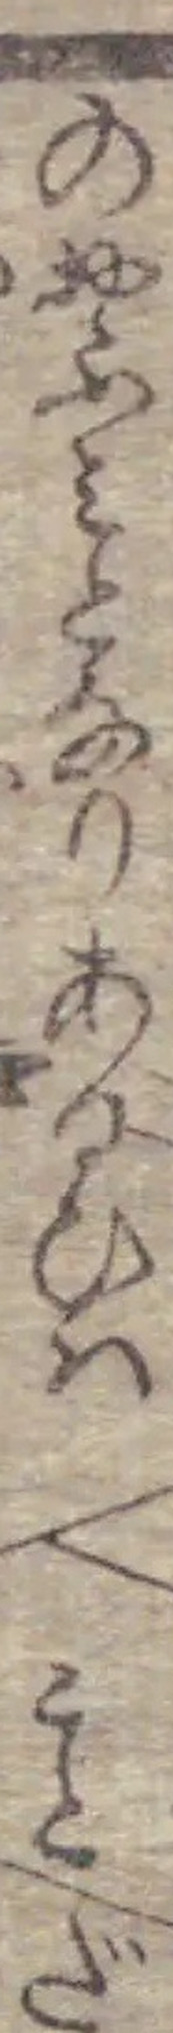のおふみとなりあるひは
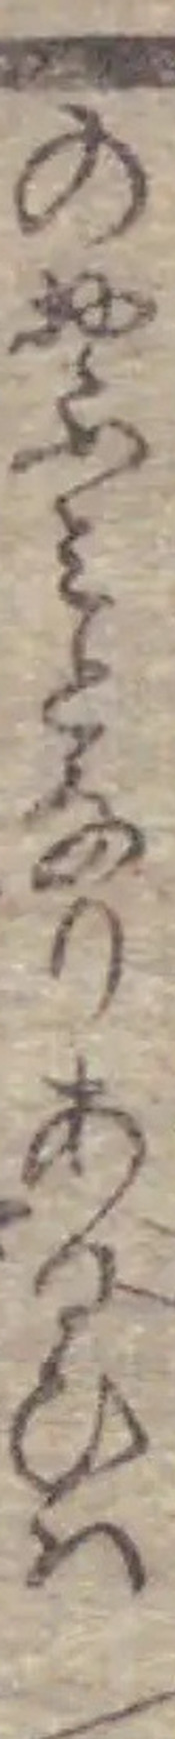のおふみとなりあるひは
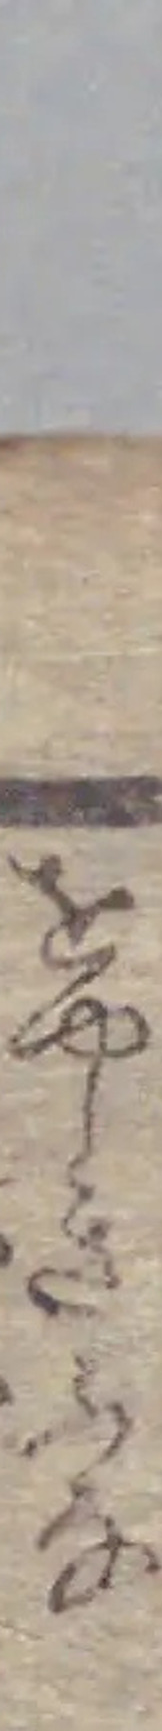をやしきふな
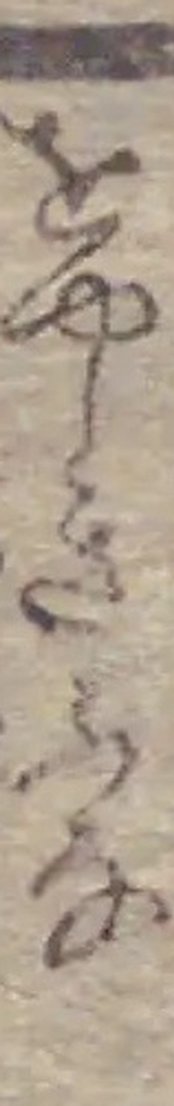をやしきふな
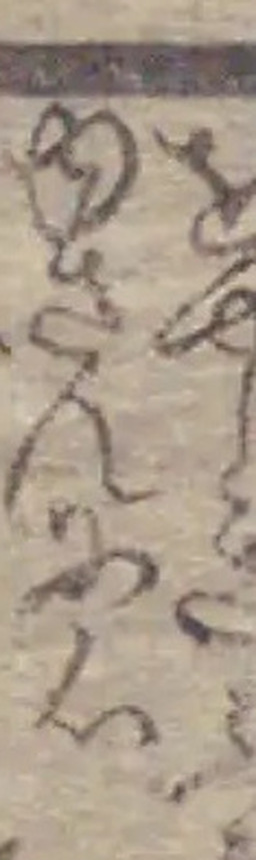ゆさんに心
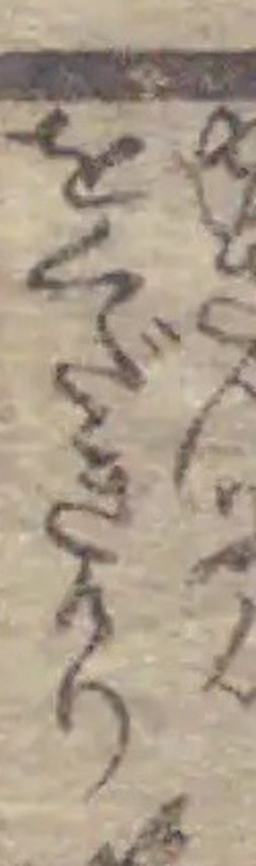をくだきけり

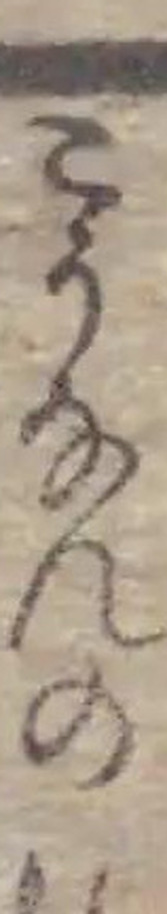こうなんの
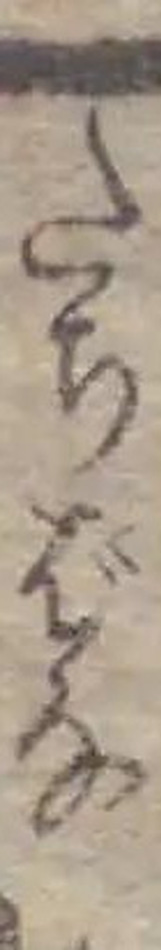たちばな
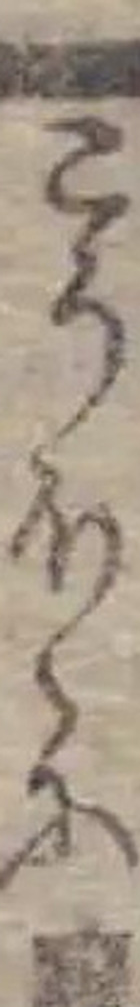こうほゝに
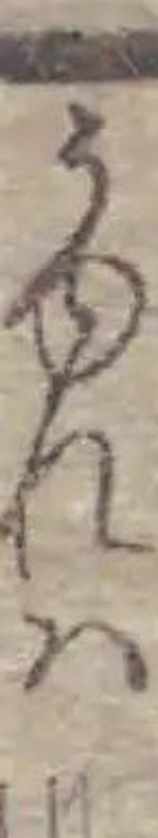うゆれは
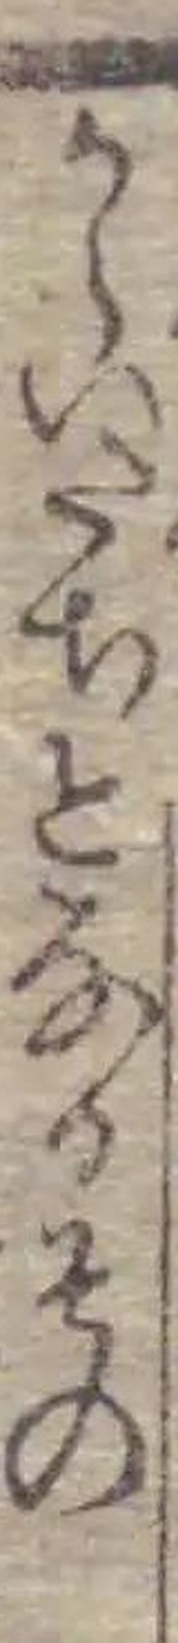からいたちとなるその
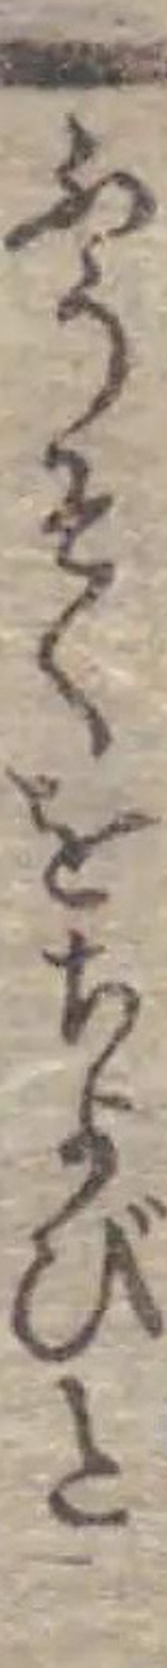ふうそくをちよびと
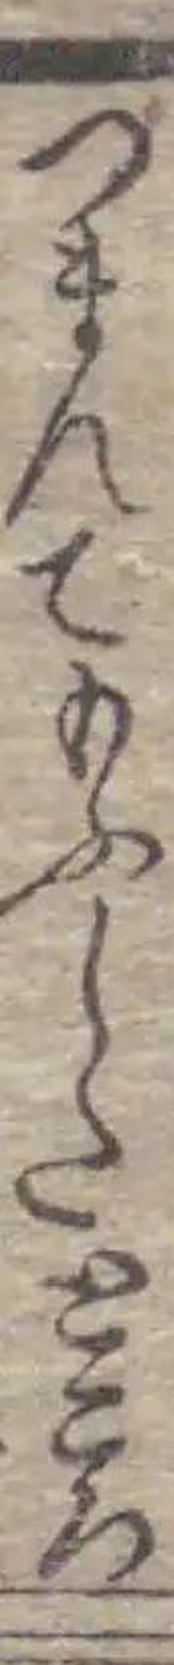つまんてもうしたところ
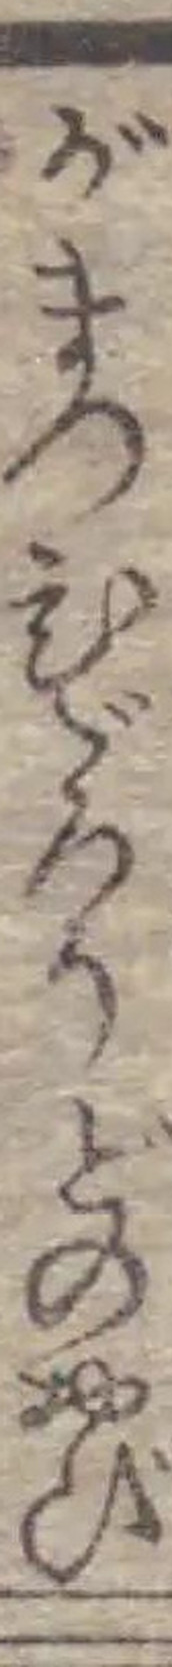がまつひゞろうどのおび
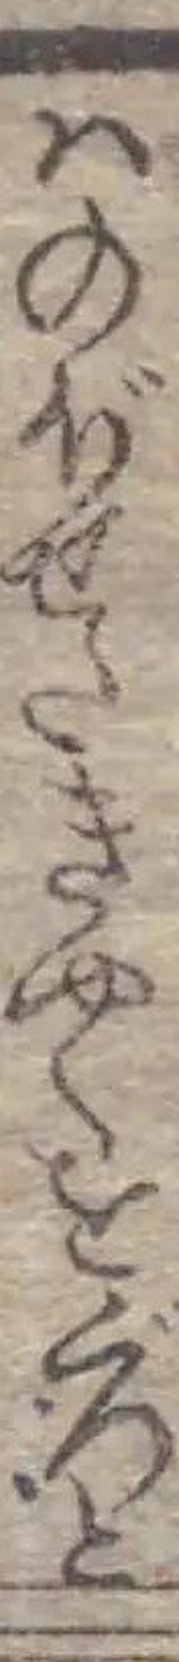はのぼせたきやくをぐつと
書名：かんなんの夢枕 2巻
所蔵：国立国会図書館 National Diet Library, JAPAN
